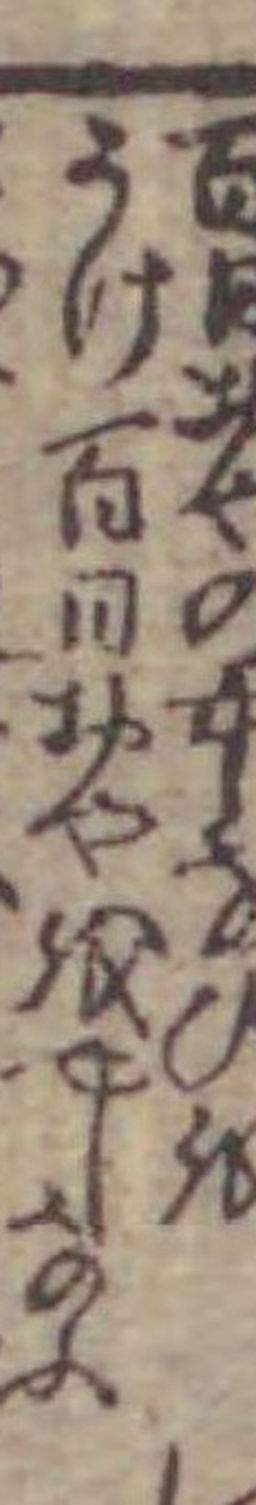うけ百日おやをやしなふ
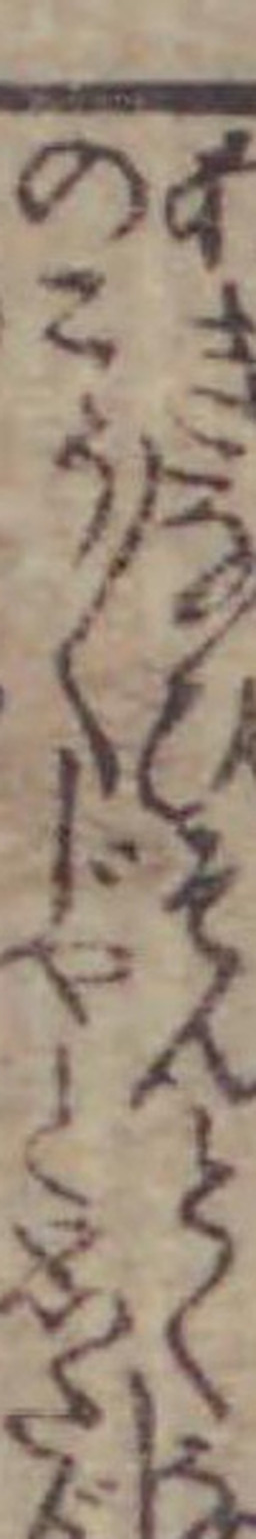のこう〳〵じやと思たが
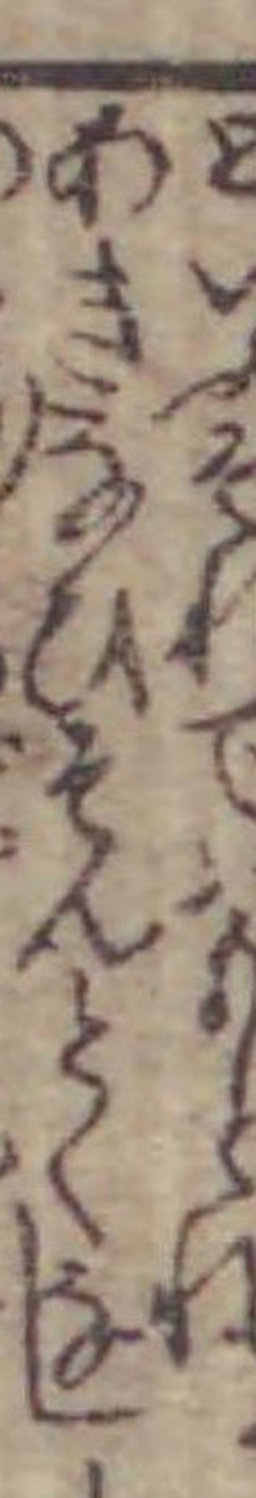あきなひそんとくなし
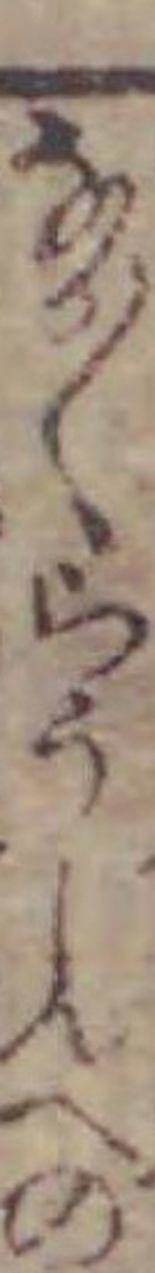なか〳〵らうしんへの
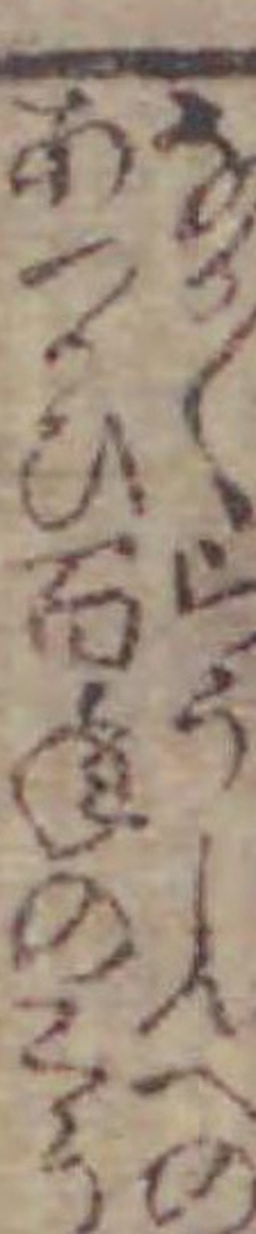あつかひ百年のこう
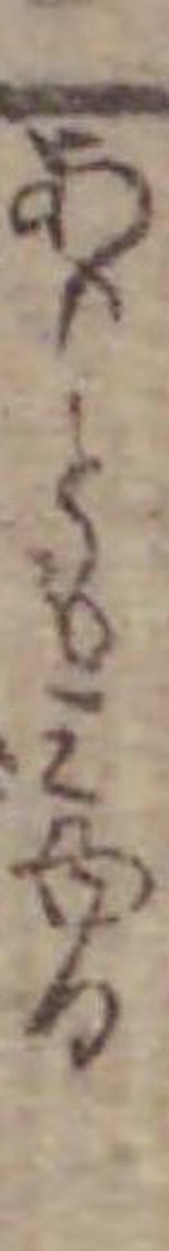ありともみゆる
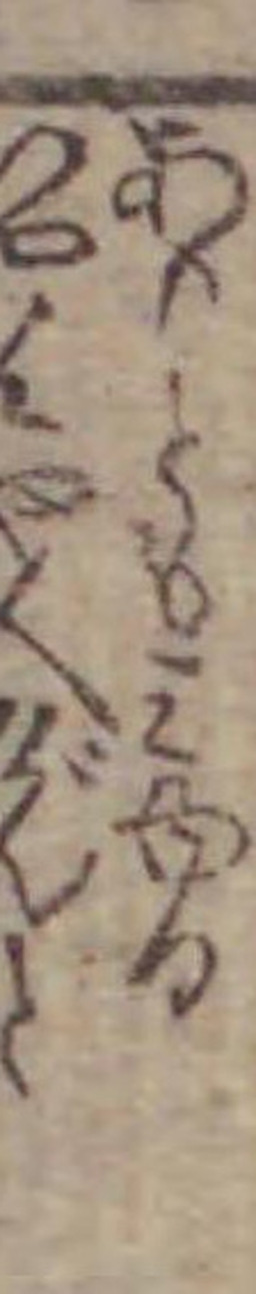いやんや人げんと
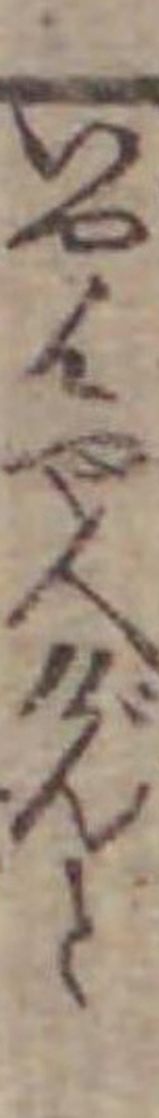いやんや人げんと
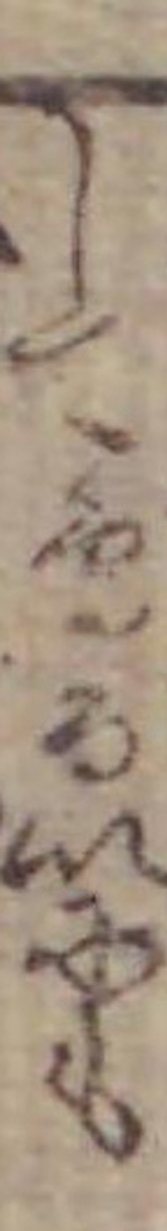して鳥るいにも
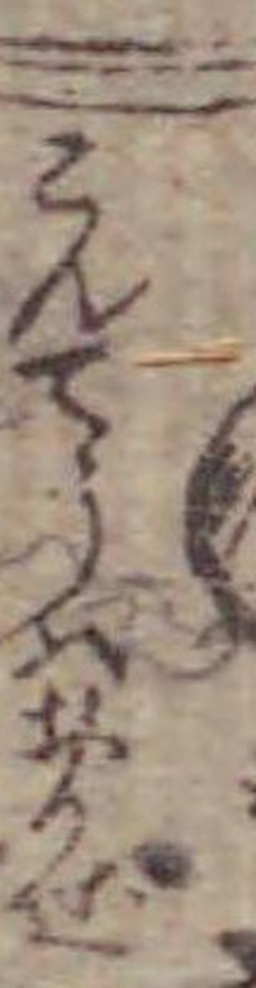こんてうはおかぜ
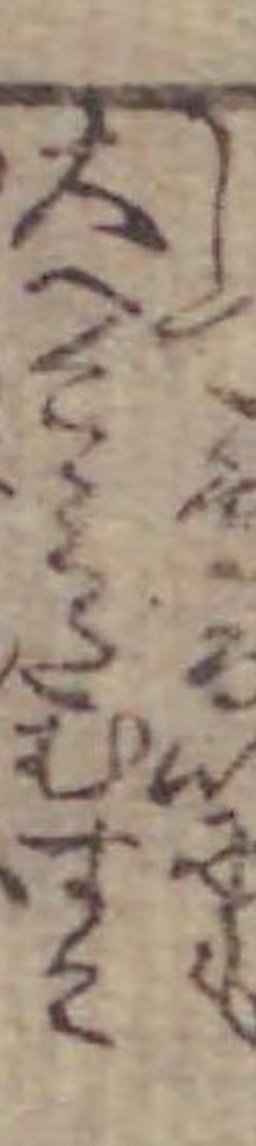大へこみたむすこ
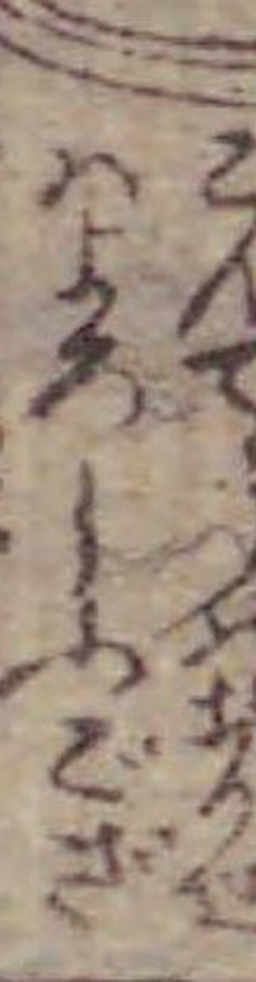はよろしふござ
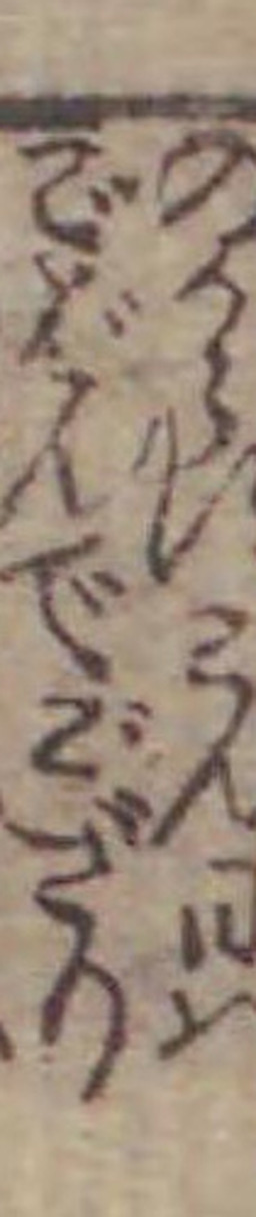ごばんでござり
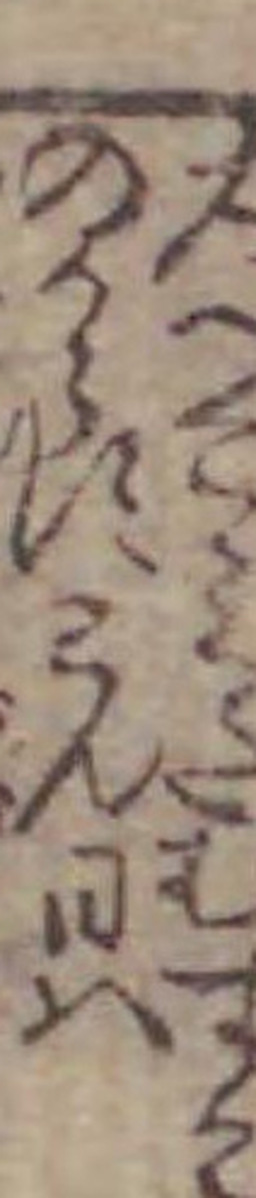のからすこん日は
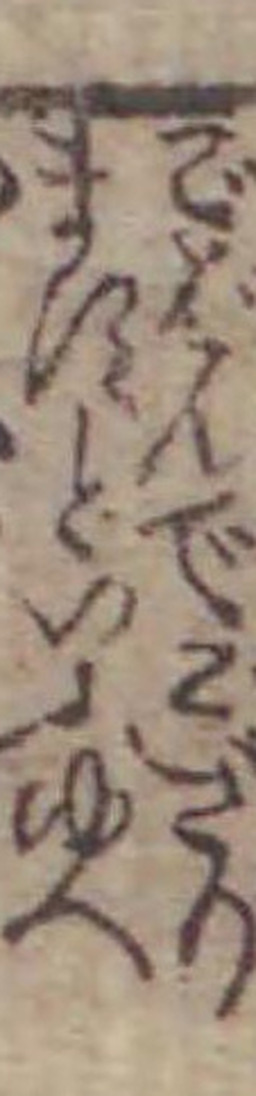ますといふゆへ
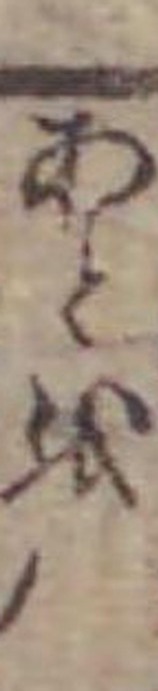あとを
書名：即席耳学問 : 3巻
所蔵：国立国会図書館 National Diet Library, JAPAN
